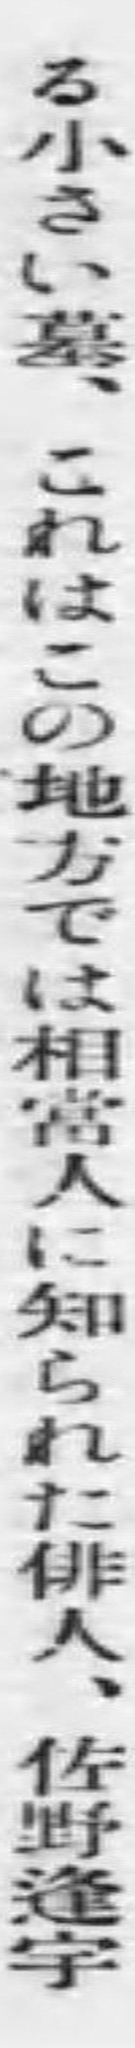る小さい墓、これはこの地方では相当人に知られた俳人、佐野逢宇
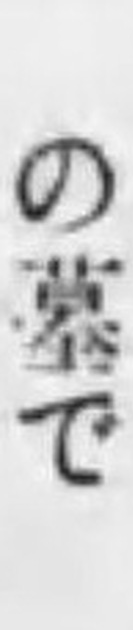の墓で
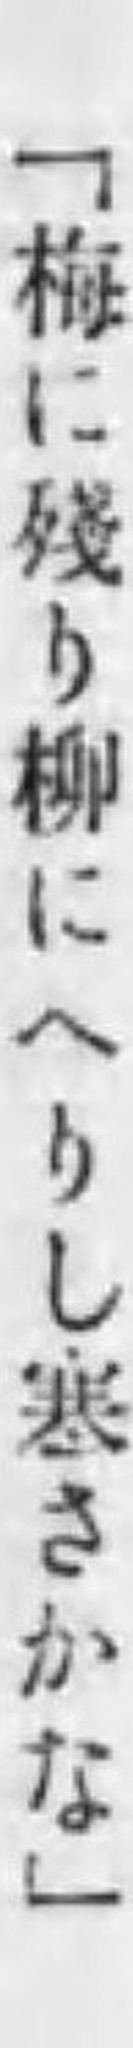「梅に残り柳にへりし寒さかな」
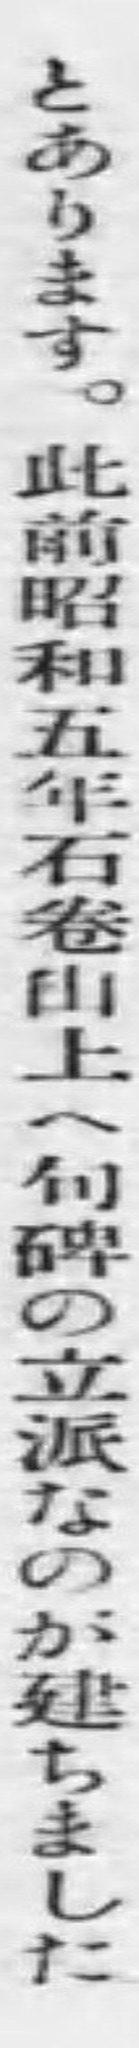とあります。此前昭和五年石巻山上へ句碑の立派なのが建ちました
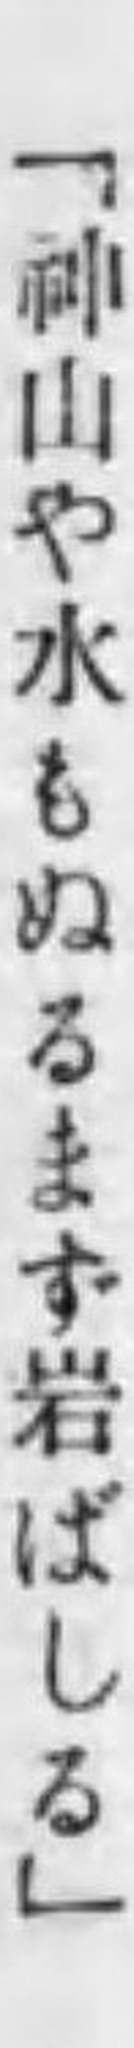「神山や水もぬるまず岩ばしる」
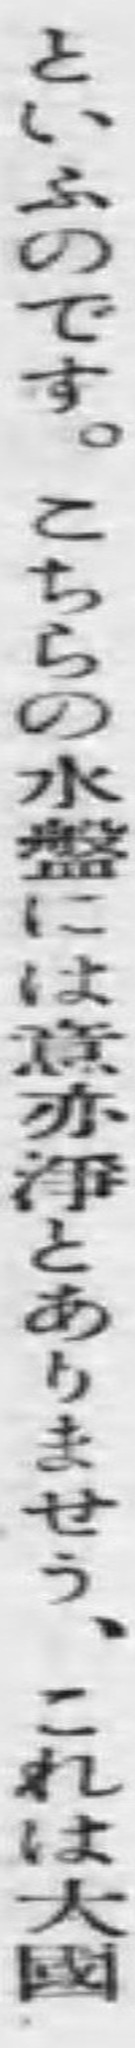といふのです。こちらの水盤には意亦浄とありませう、これは大国
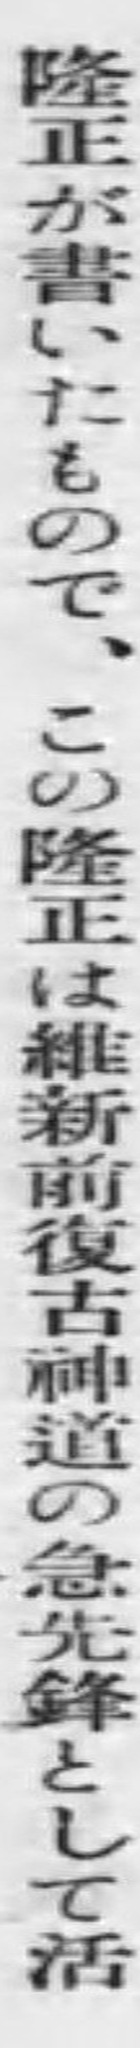隆正が書いたもので、この隆正は維新前復古神道の急先鋒として活
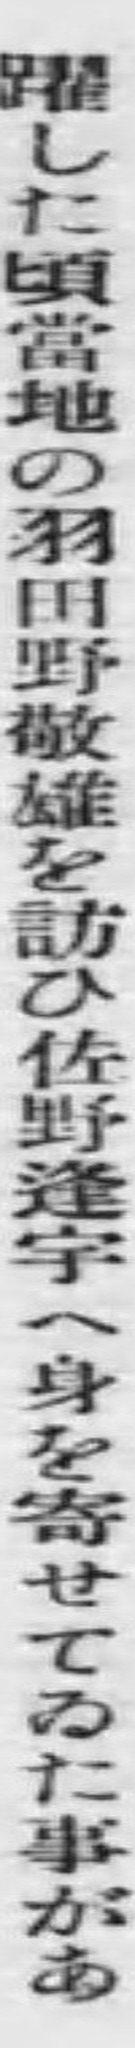躍した頃当地の羽田野敬雄を訪ひ佐野逢宇へ身を寄せてゐた事があ
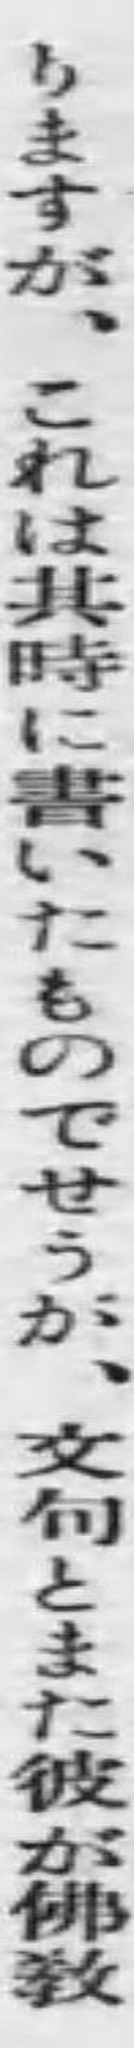りますが、これは其時に書いたものでせうが、文句とまた彼が仏教
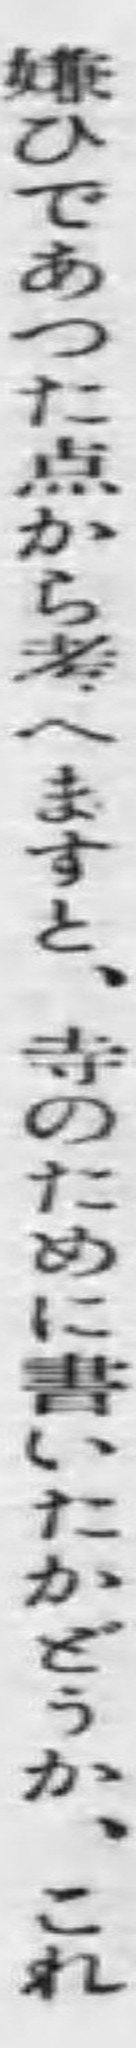嫌ひであつた点から考へますと、寺のために書いたかどうか、これ
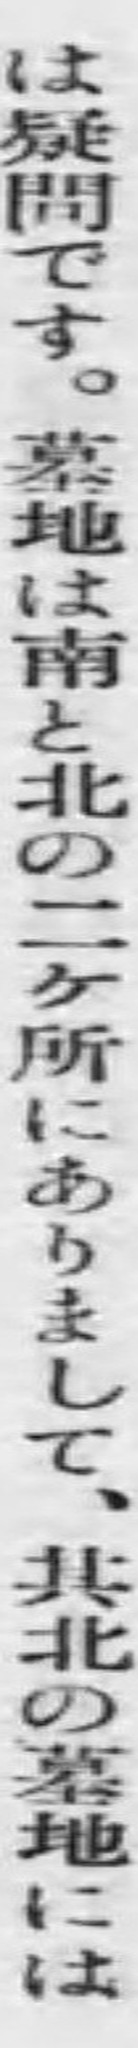は疑問です。墓地は南と北の二ヶ所にありまして、其北の墓地には
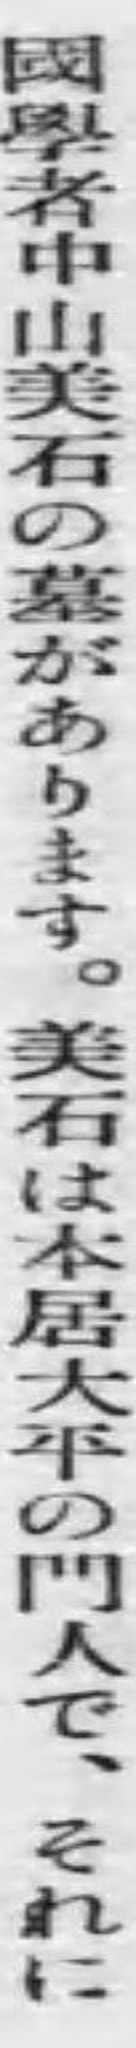国学者中山美石の墓があります。美石は本居大平の門人で、それに
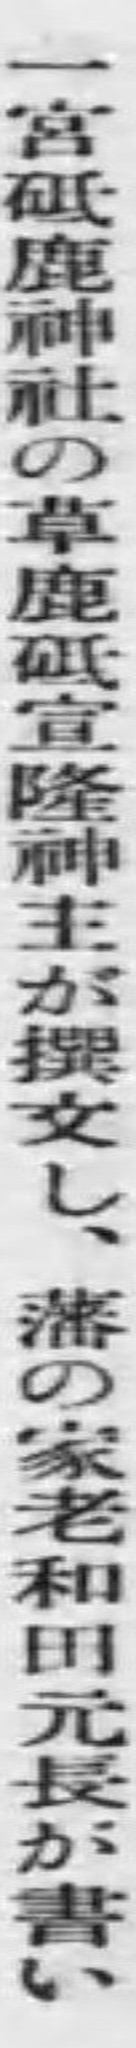一宮砥鹿神社の草鹿砥宣隆神主が撰文し、藩の家老和田元長が書い
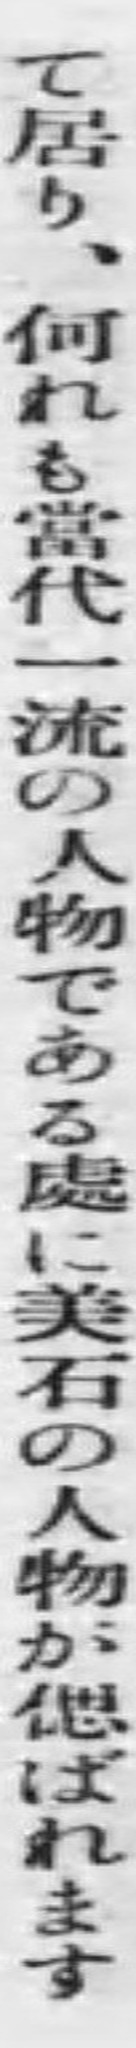て居り、何れも当代一流の人物である処に美石の人物が偲ばれます
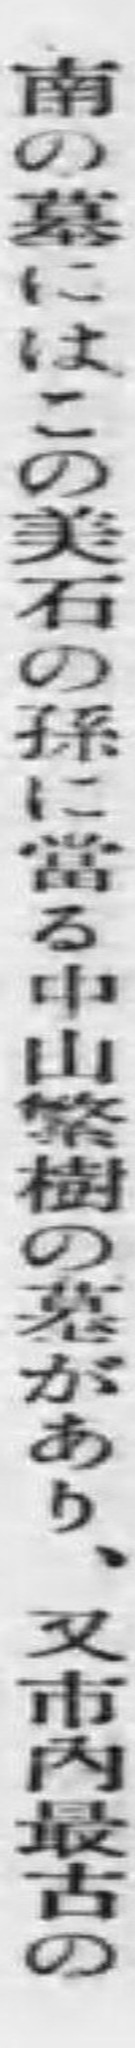南の墓にはこの美石の孫に当る中山繁樹の墓があり、又市内最古の
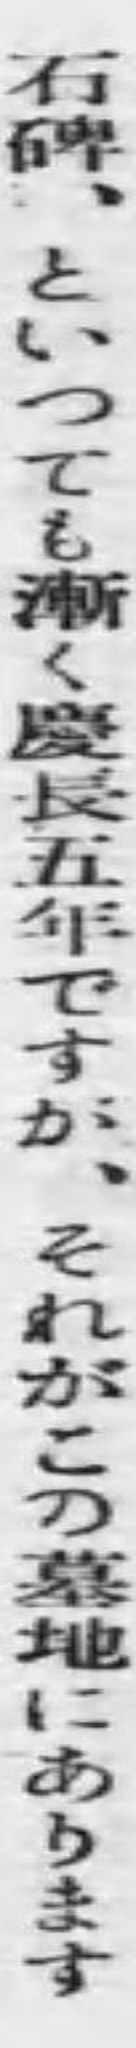石碑、といつても漸く慶長五年ですが、それがこの墓地にあります
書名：東三河道中記 : 豊橋市及其附近案内
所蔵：国立国会図書館 National Diet Library, JAPAN
